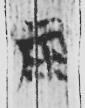雨
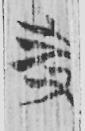寺
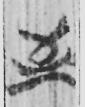至
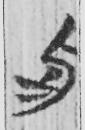此
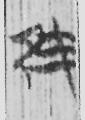隹
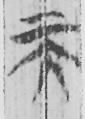天
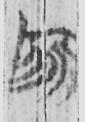所
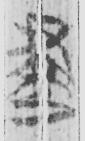建
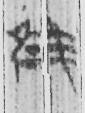隹
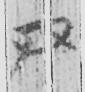四
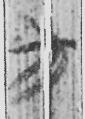方
